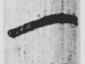一
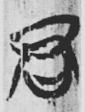君
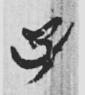子
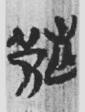○（喪）
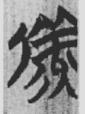備（服）
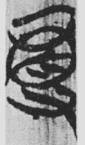曼（絻）
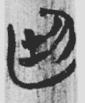廷（徑）
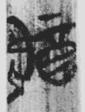𨟻（將）
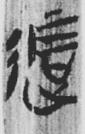{辶石}（蹠）
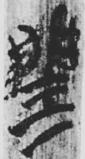閨
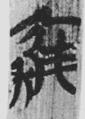○{宀稚}（稚）
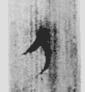人
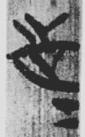歨歨
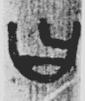曰
